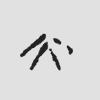大
